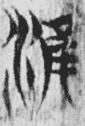淮
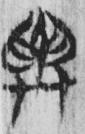與
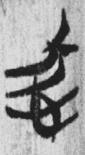忻（沂）
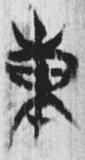東
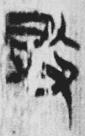○（注）
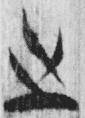之
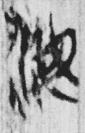○（海）
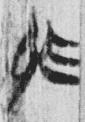於
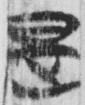是
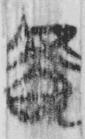唬（乎）
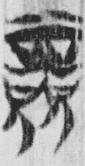競
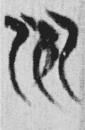州
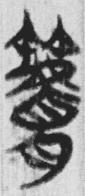○（莒）
